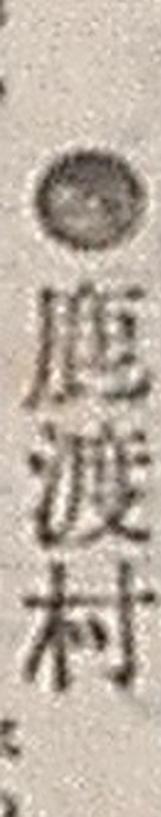●鹿渡村
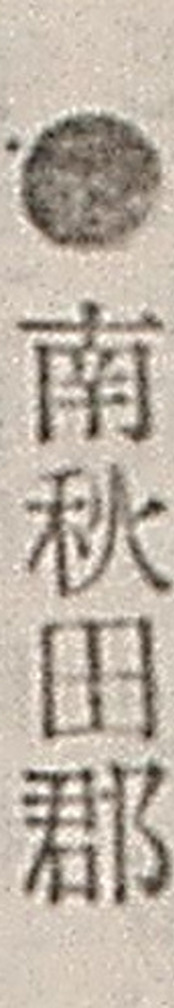●南秋田郡
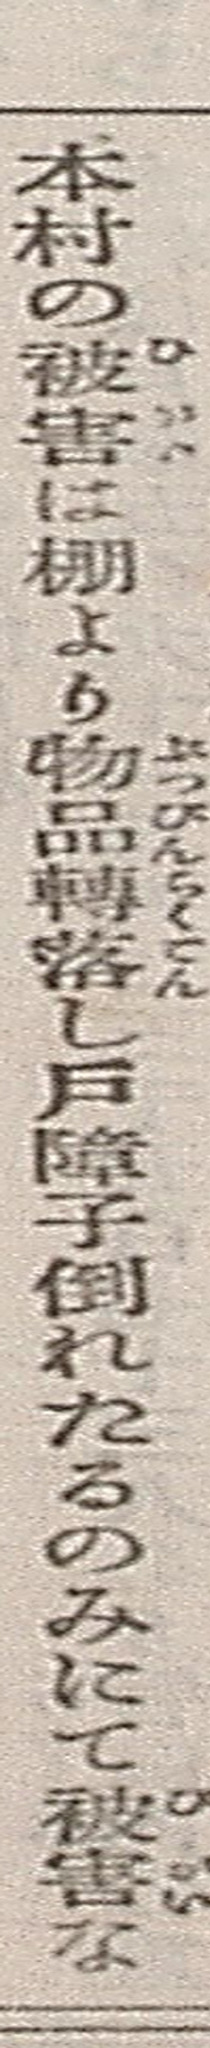本村の被害は棚より物品転落し戸障子倒れたるのみにて被害な
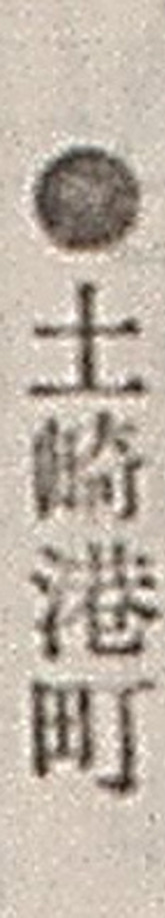●土崎港町
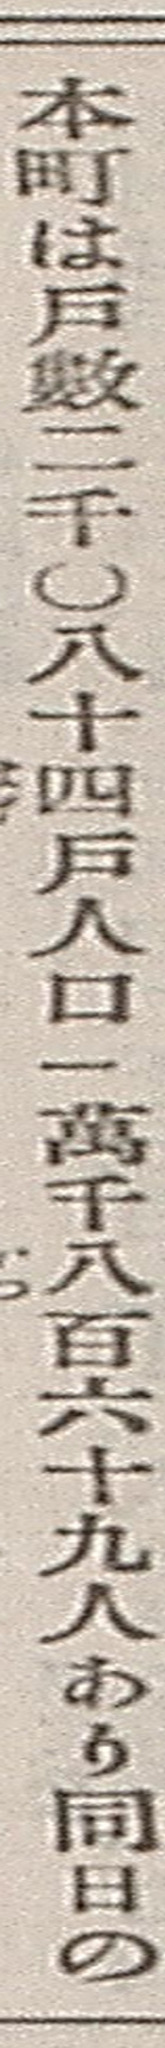本町は戸数二千〇八十四戸人口一万千八百六十九人あり同日の
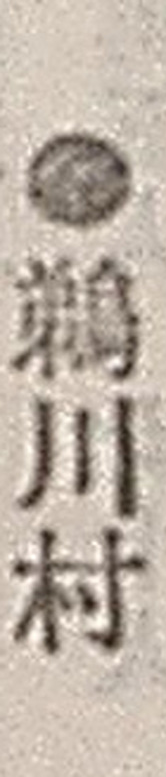●鵜川村
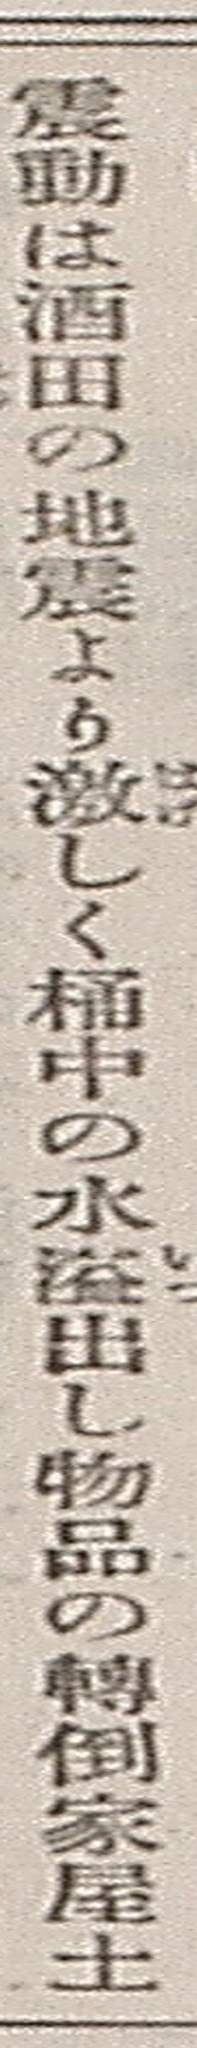震動は酒田の地震より激しく桶中の水溢出し物品の転倒家屋土
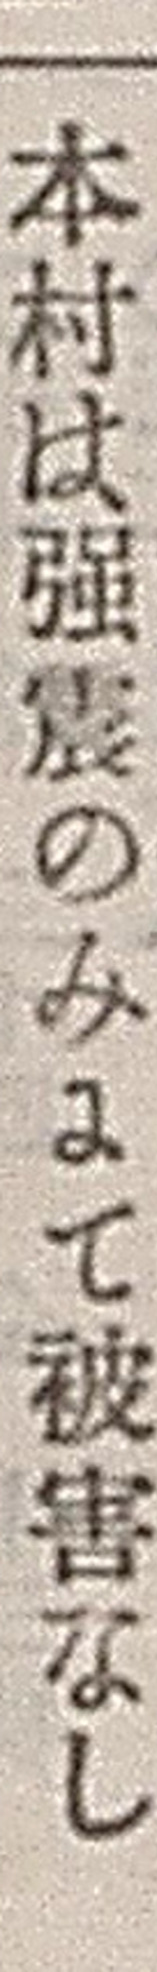本村は強震のみにて被害なし
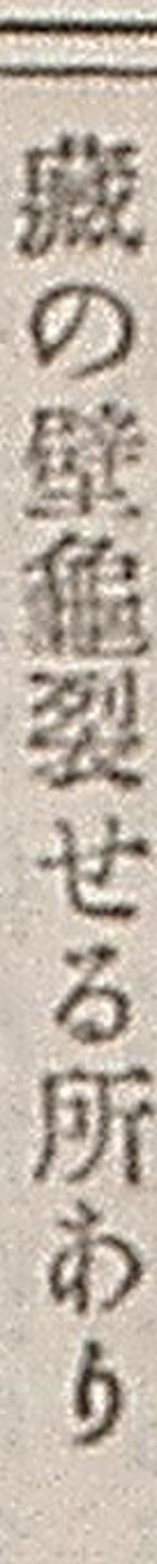蔵の壁亀裂せる所あり
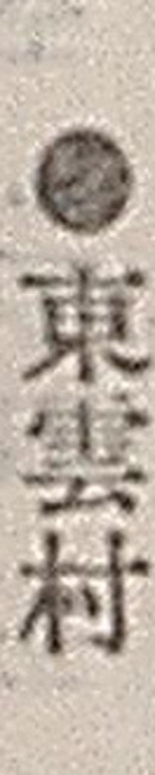●東雲村
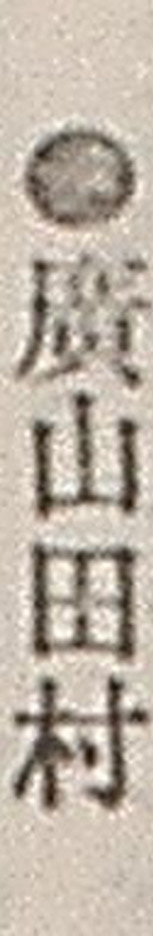●広山田村
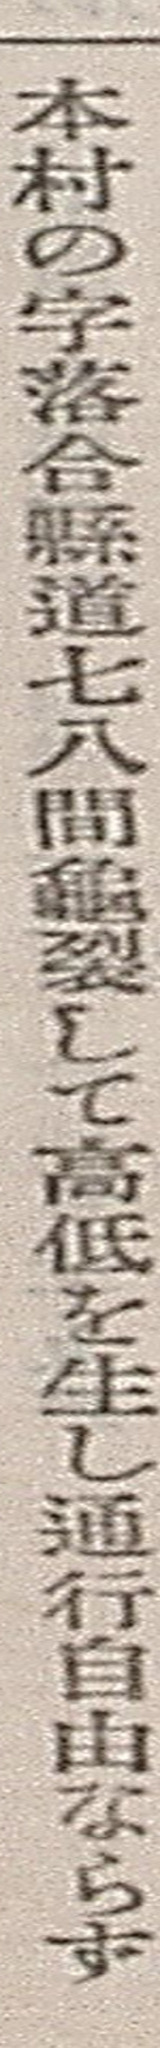本村の字落合県道七八間亀裂して高低を生し通行自由ならず
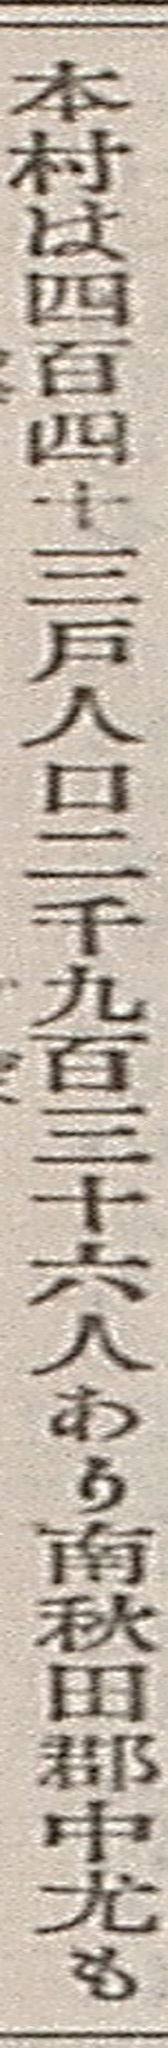本村は四百四十三戸人口二千九百三十六人あり南秋田郡中尤も
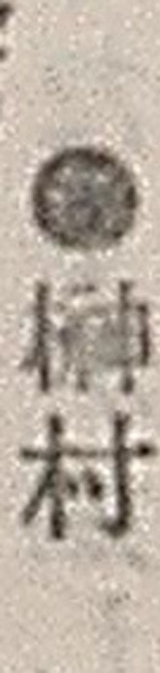●榊村
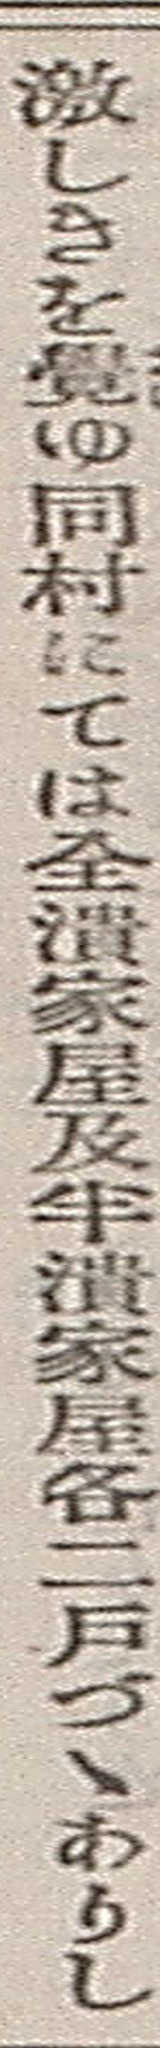激しきを覚ゆ同村にては全潰家屋及半潰家屋各二戸づゝありし
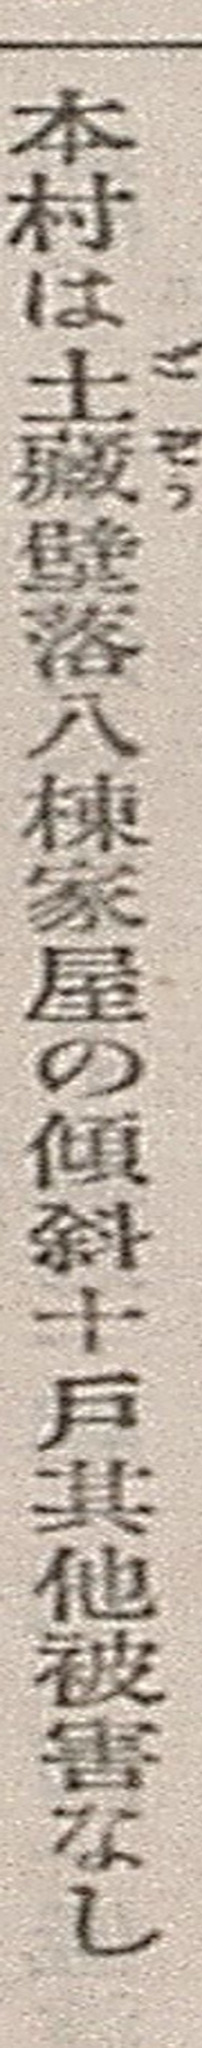本村は土蔵壁落八棟家屋の傾斜十戸其他被害なし
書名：風俗畫報臨時増刊第百二十四號　洪水地震被害録（上）
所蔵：東京大学地震研究所図書室 Earthquake Research Institute Library, The University of Tokyo, JAPAN
